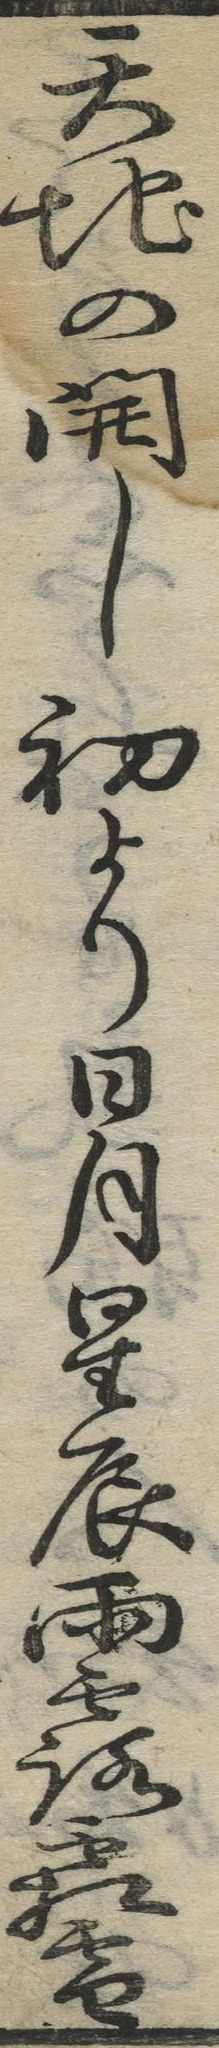天地の開し初より日月星辰雨露霜雹
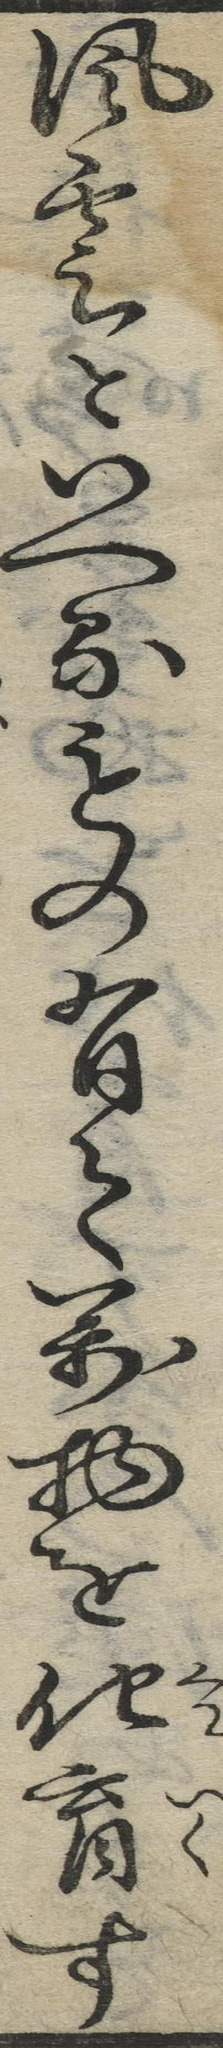風雲といへるもの有て萬物を化育す
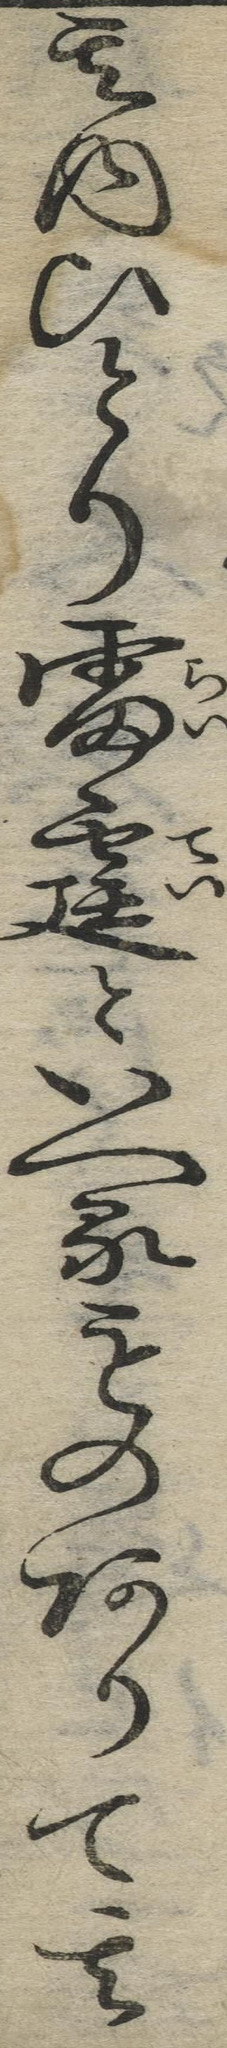其内ひとり雷霆といへるものありて其

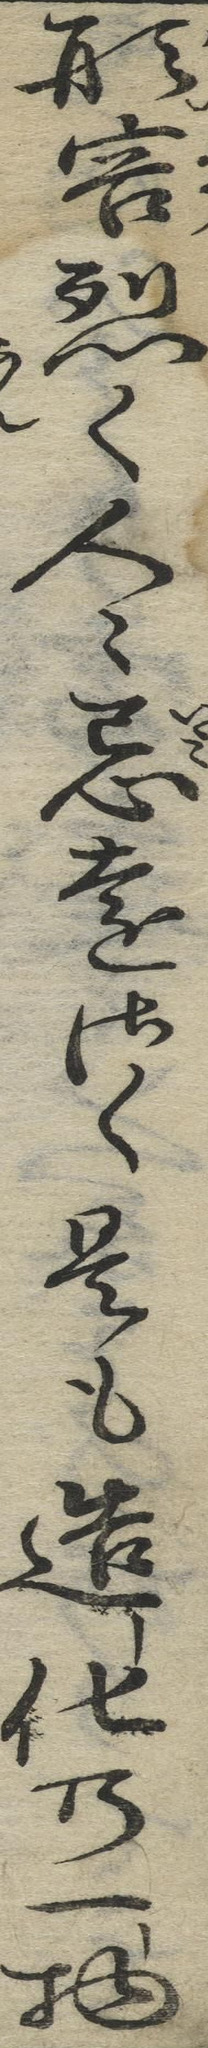形容烈く人々忌遠さく是も造化の一物
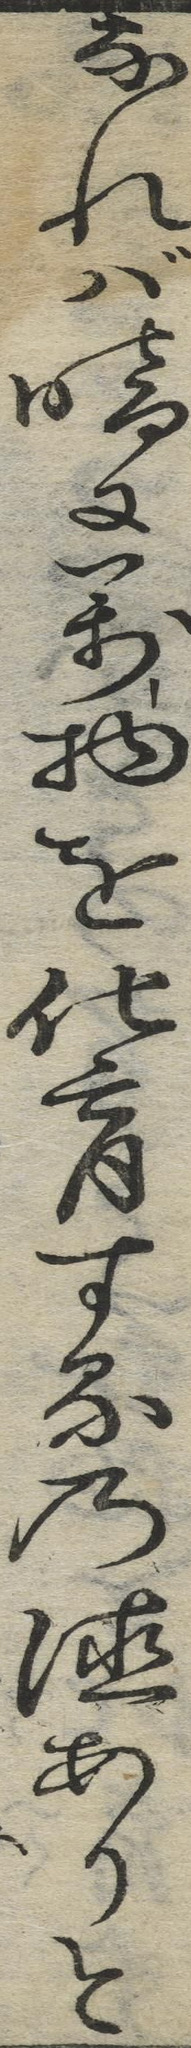なれば暗に萬物を化育するの徳ありと
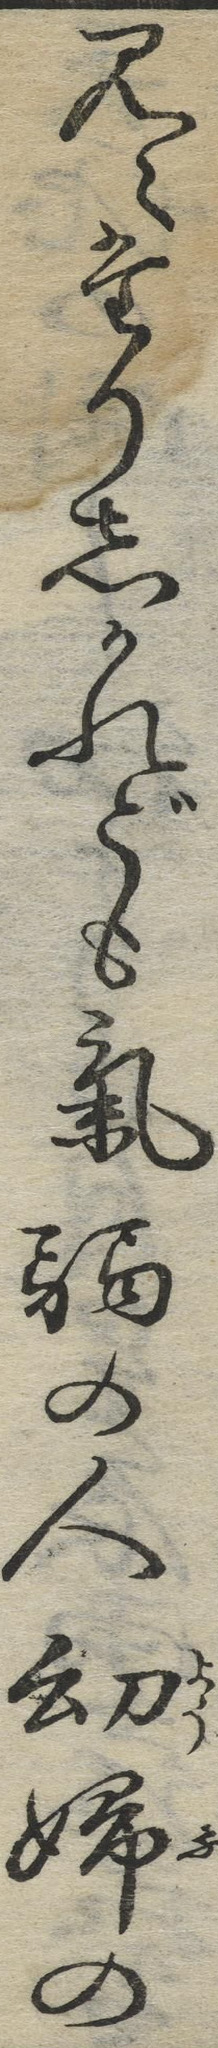見えたりしかれども気弱の人幼婦の
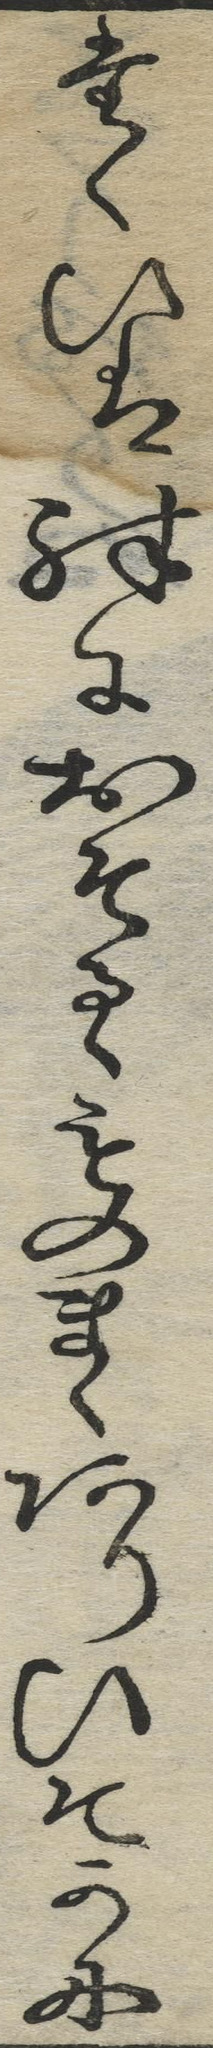たくひは殊におそるゝものまゝありひそかに
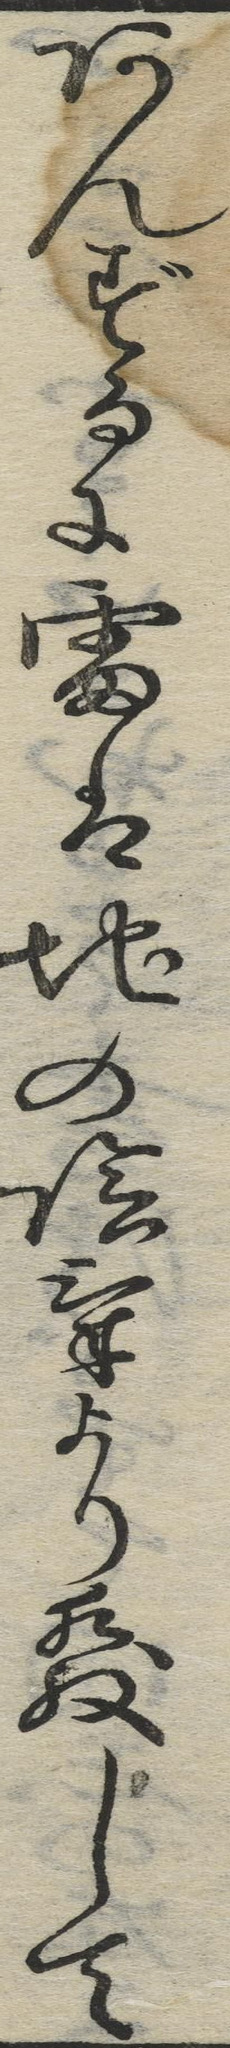あんずるに雷は地の陰気より發して
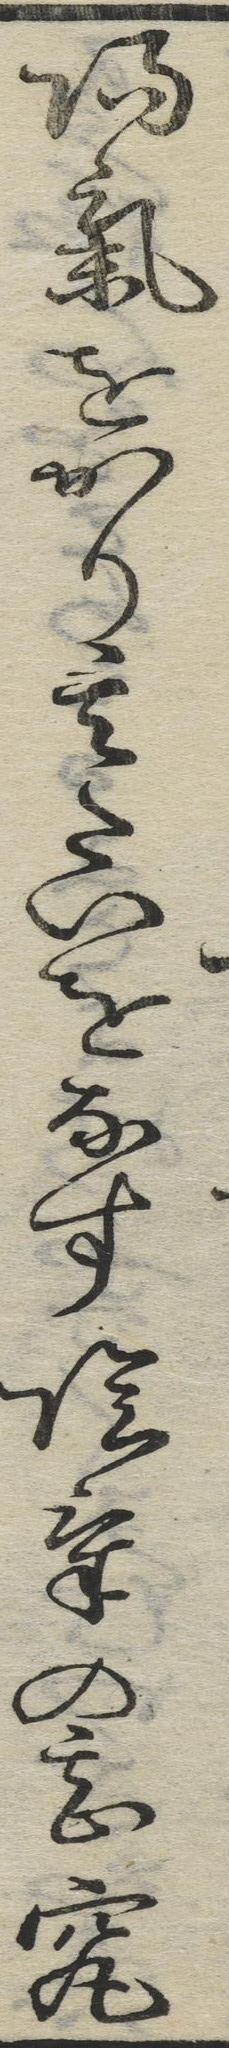陽気をかり其たいをなす陰気の甚究
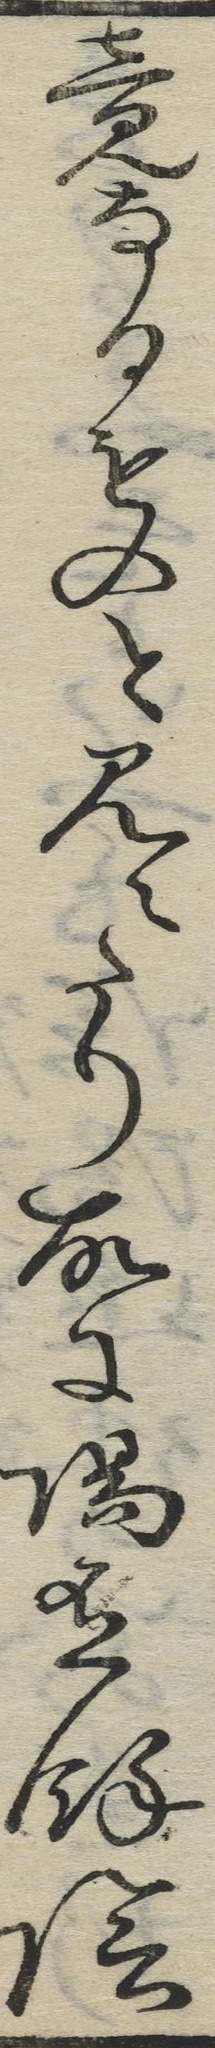竟なるものと見えたり故に陽有餘陰
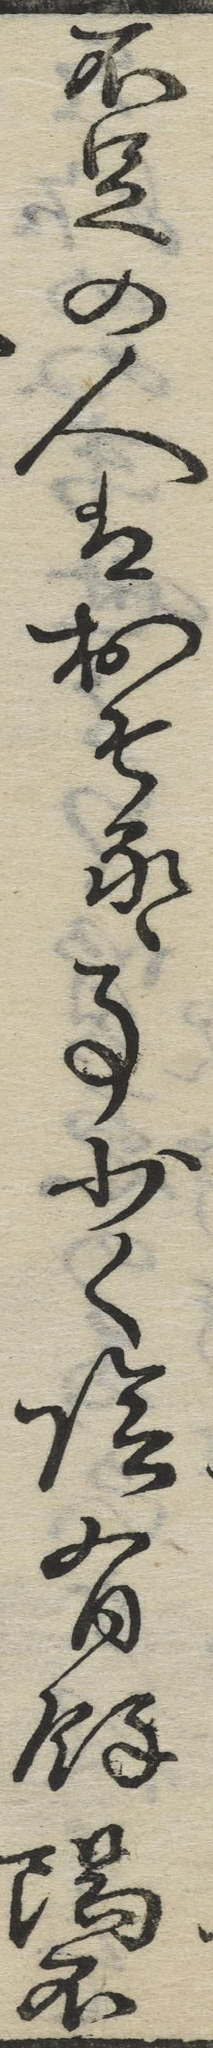不足の人はおそるゝ事少く陰有餘陽不
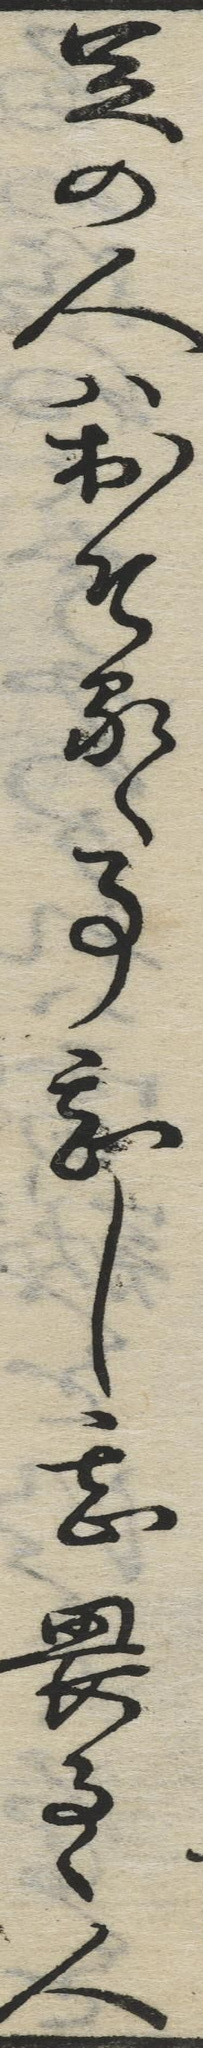足の人はおそるゝ事甚し甚畏るゝ人
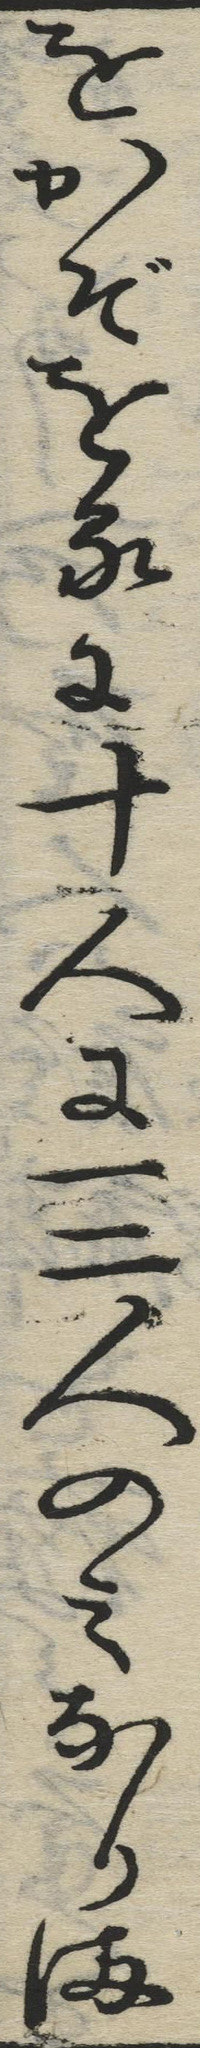をかぞをるに十人に一二人のみなりま
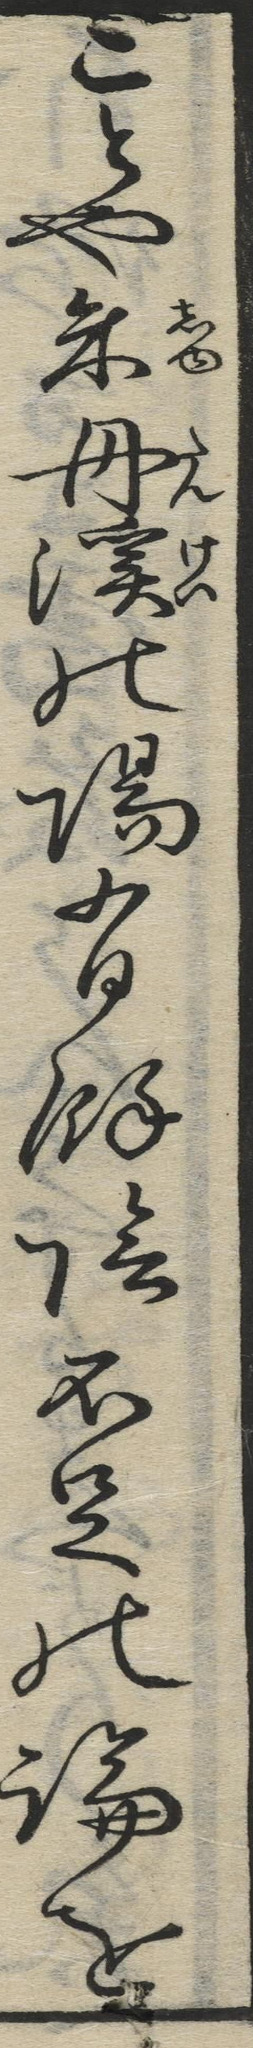ことや朱丹渓の陽有餘陰不足の論を
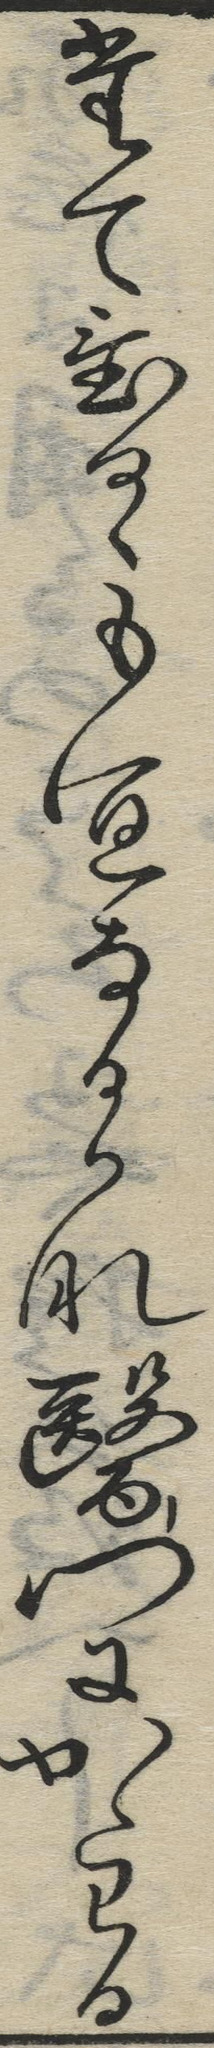たて置るゝも宜なるかな醫門にかゝわる
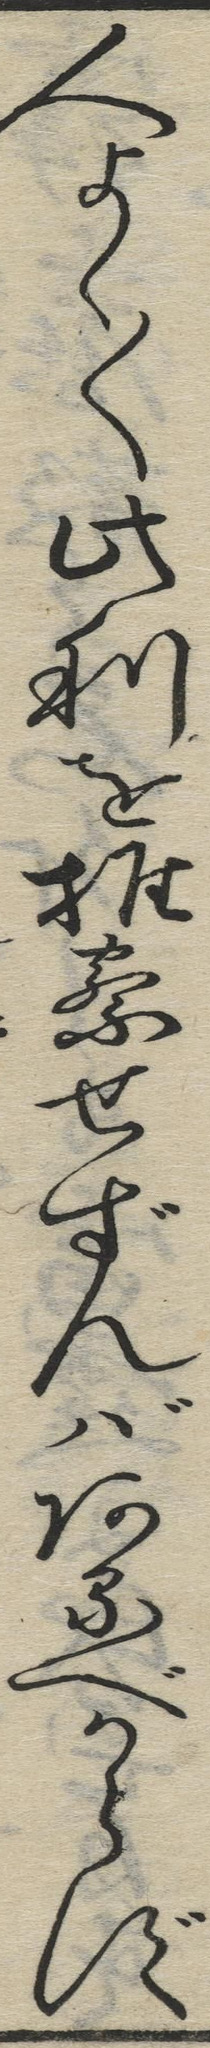人よく〳〵此利を推察せずんばあるべからず
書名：雷震記　完
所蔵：東京大学地震研究所図書室 Earthquake Research Institute Library, The University of Tokyo, JAPAN
